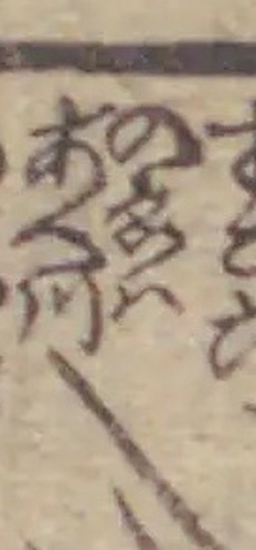あへ川
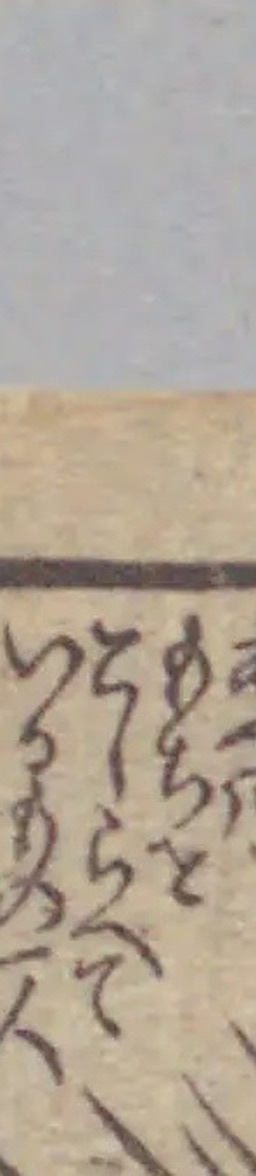いるもの一人
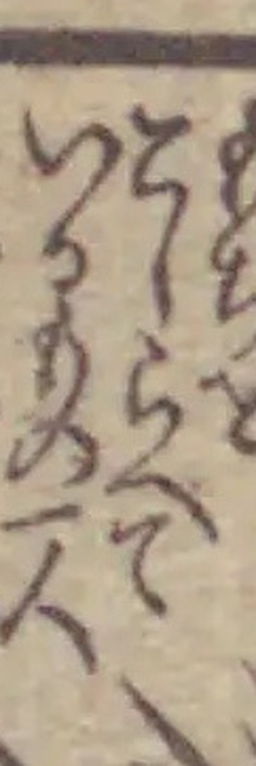いるもの一人
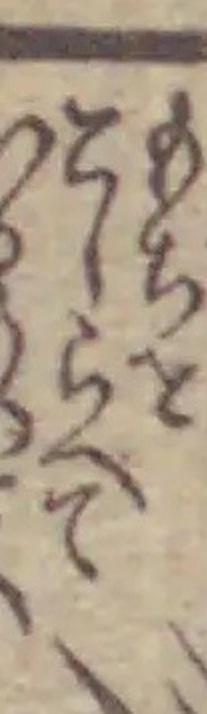こしらへて
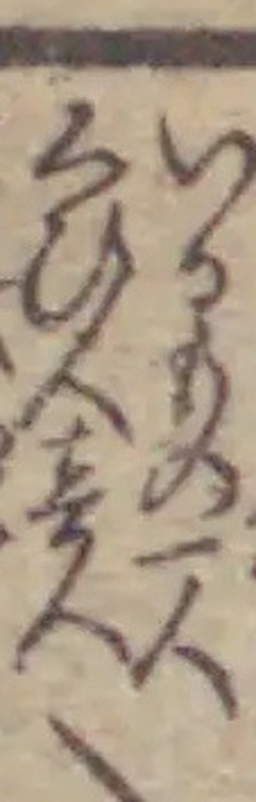くひ人壱人
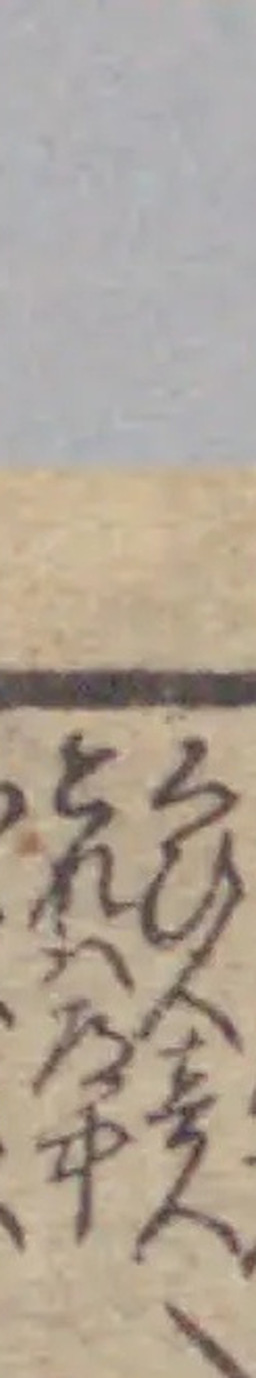これは道中
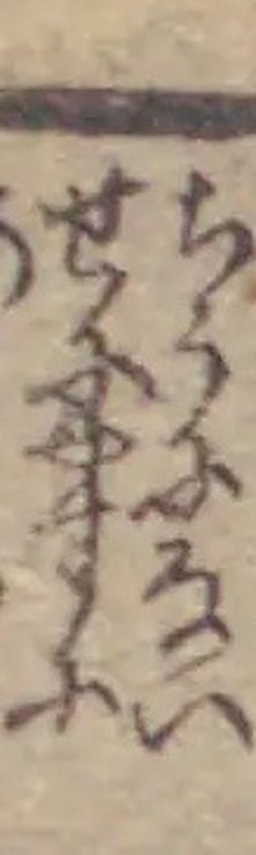せにやすに
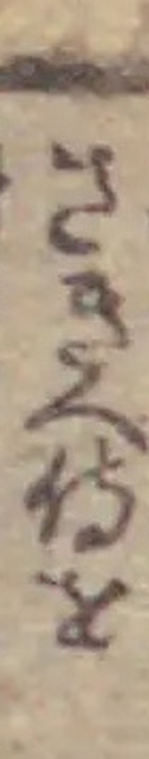さきへ侍を
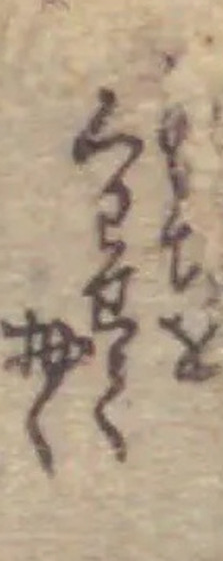くわせて

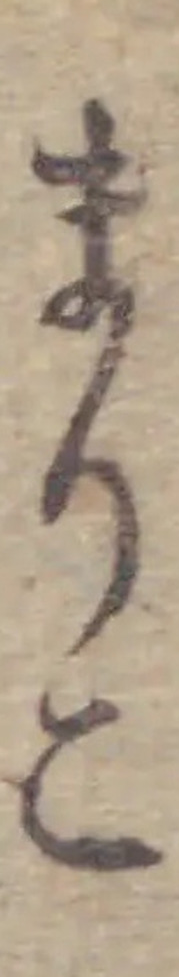まりこ
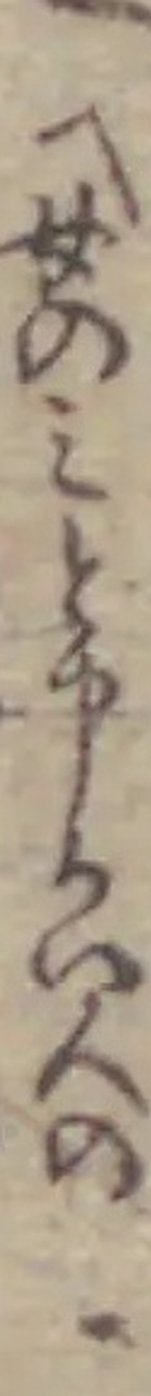〽女のみと申かい人の
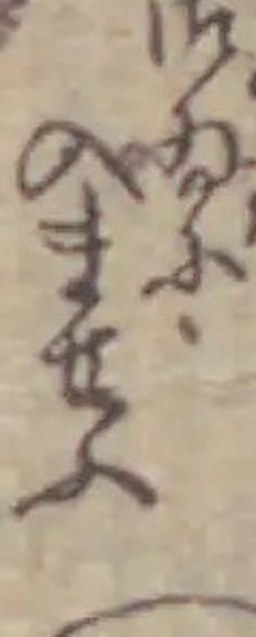入ませふ
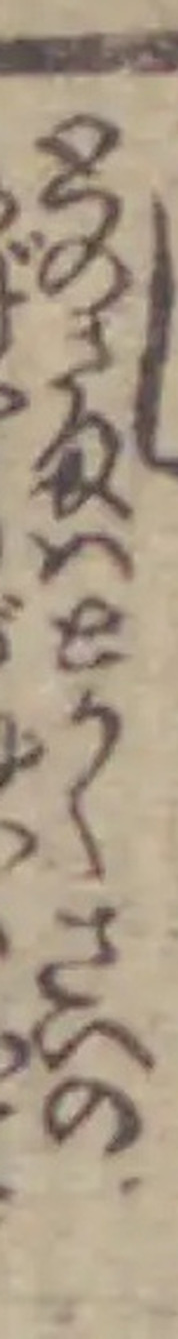とのさまはとかくさいの
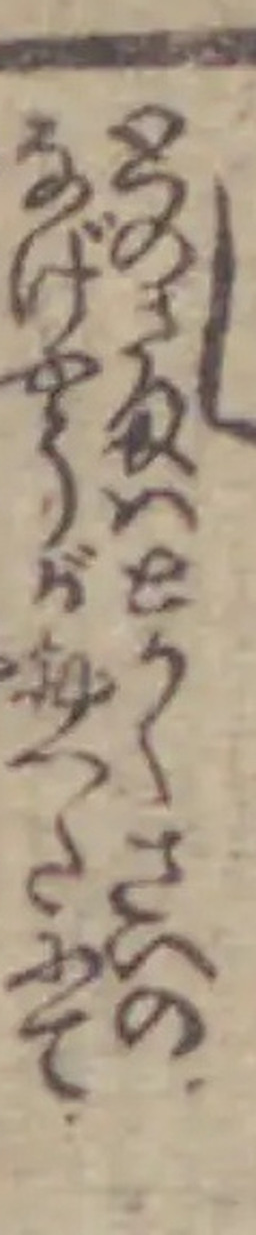なげやうがおへたにて
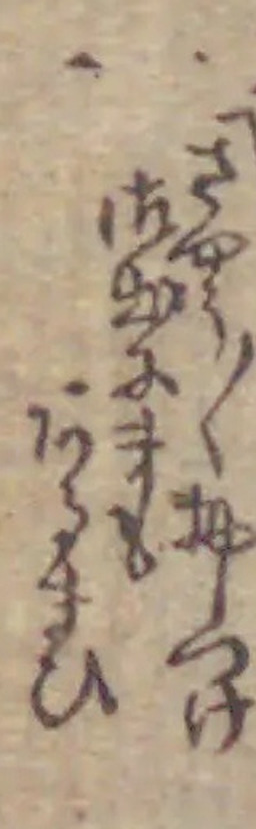御出にまも
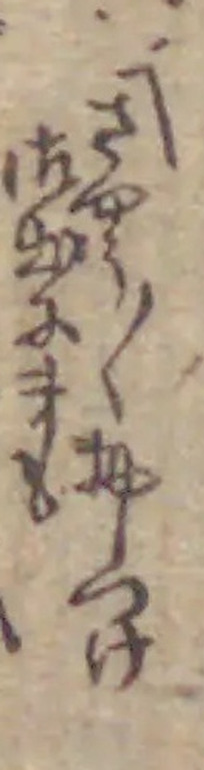〽さやう〳〵おしつけ
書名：道笑双六
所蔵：国立国会図書館 National Diet Library, JAPAN
